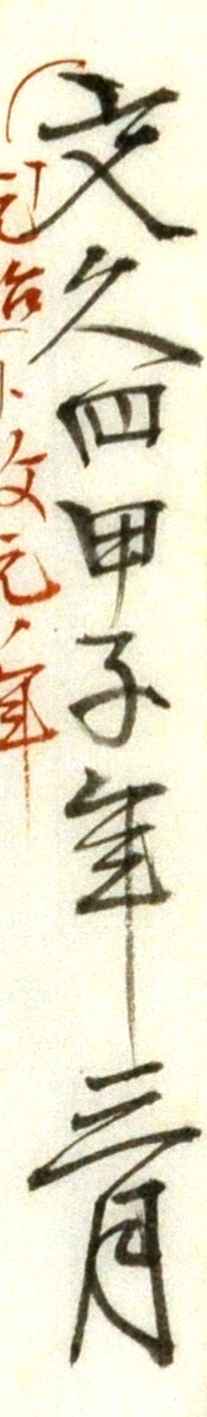文久四甲子年三月
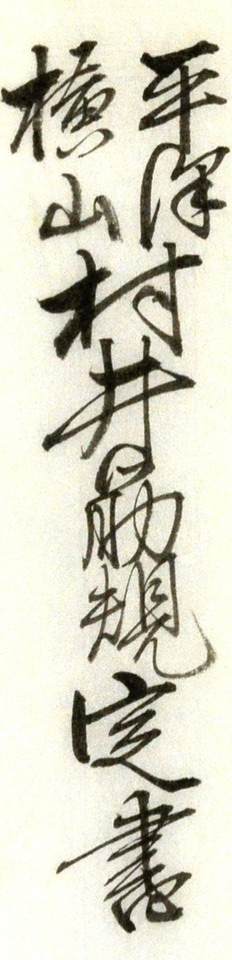横山村井筋規定書
